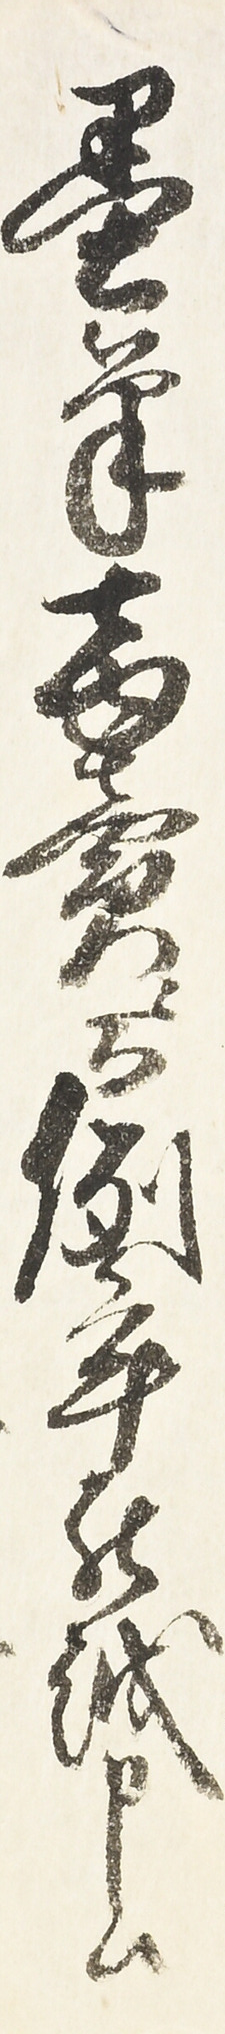墨筆商売ニ而例年罷越申候
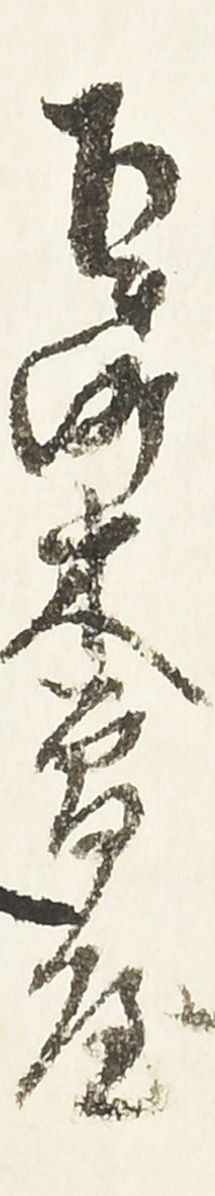下モ町木曽屋
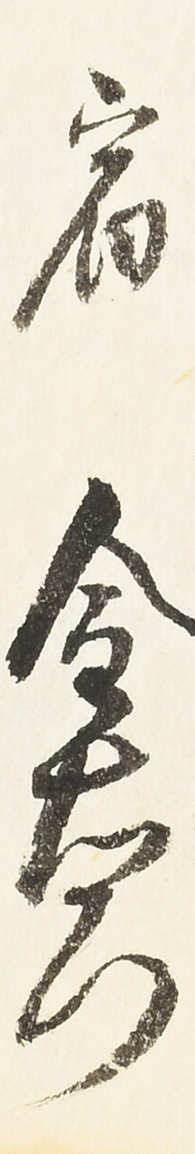宿金右衛門
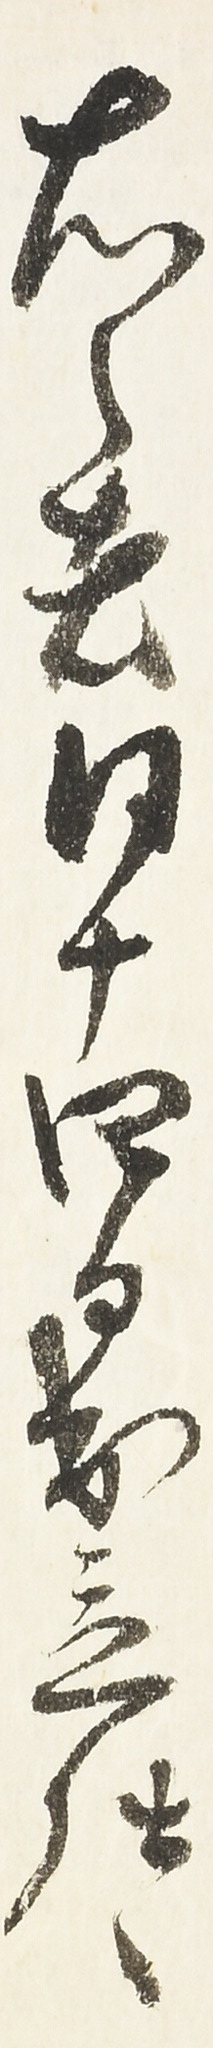右之者同十四日出立仕候
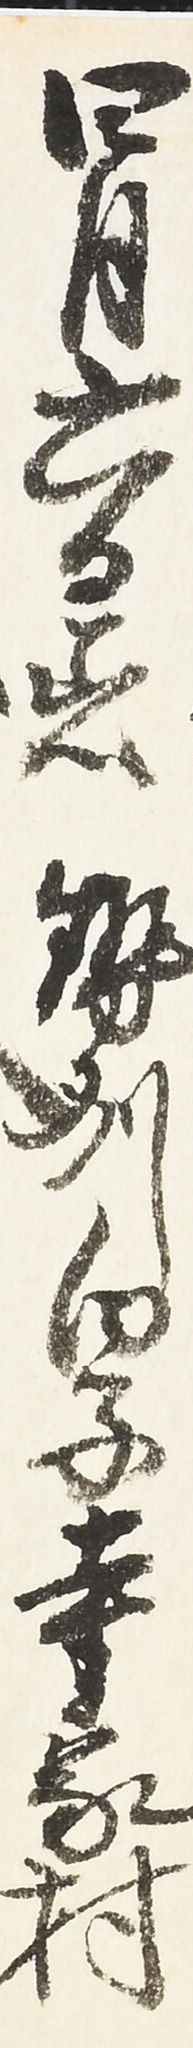四月六日着勢州白子寺家村
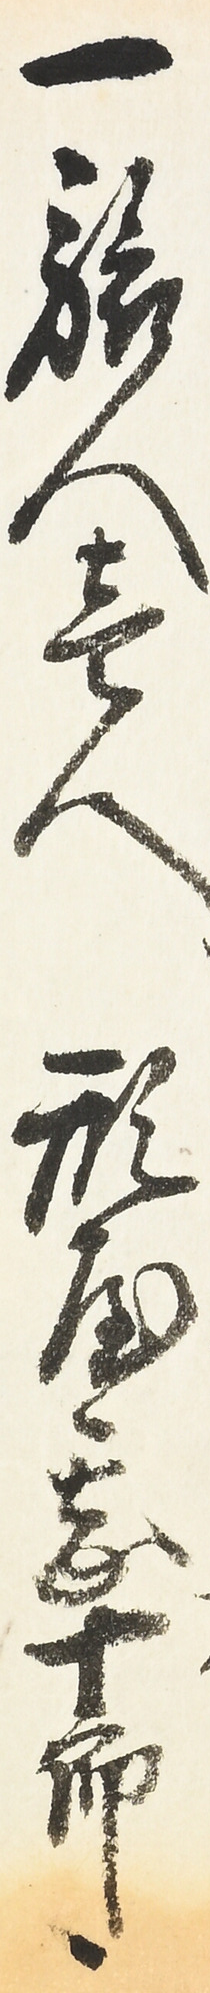一旅人壱人形屋甚十郎・
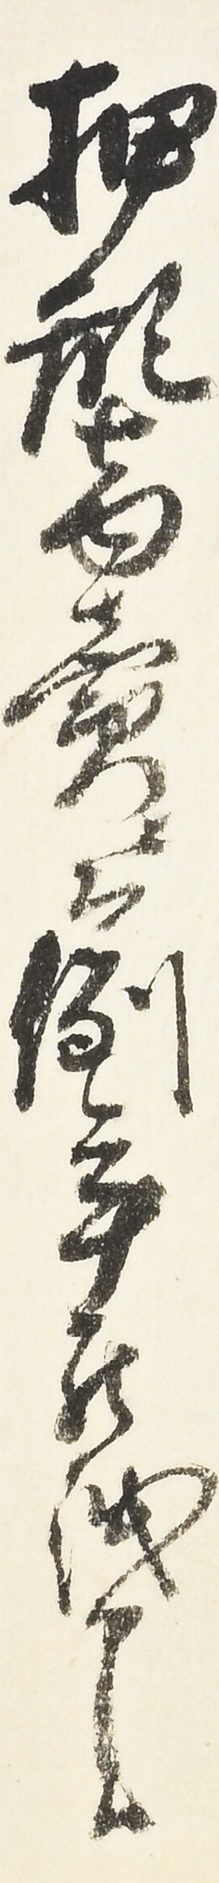押形商売ニ而例年罷越申候
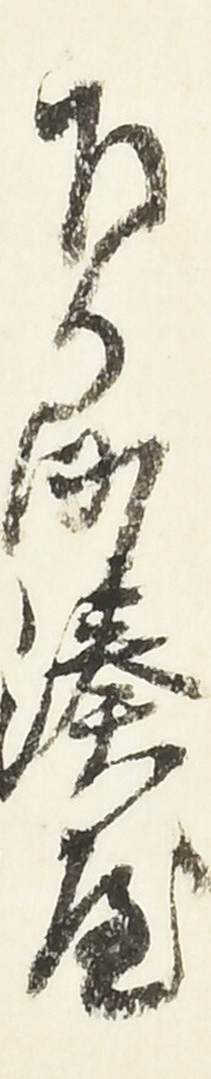下リ町湊屋
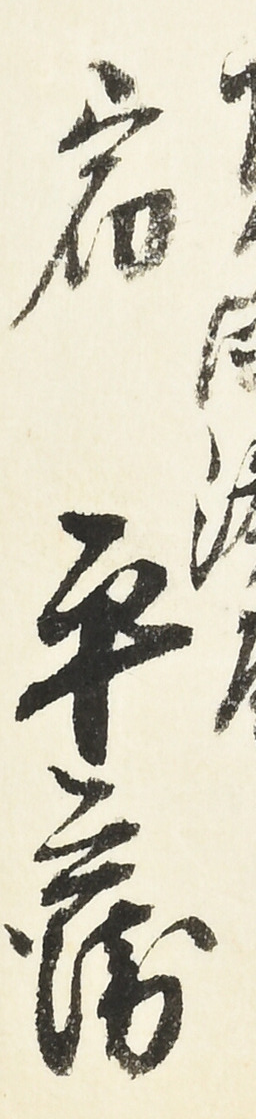宿平兵衛
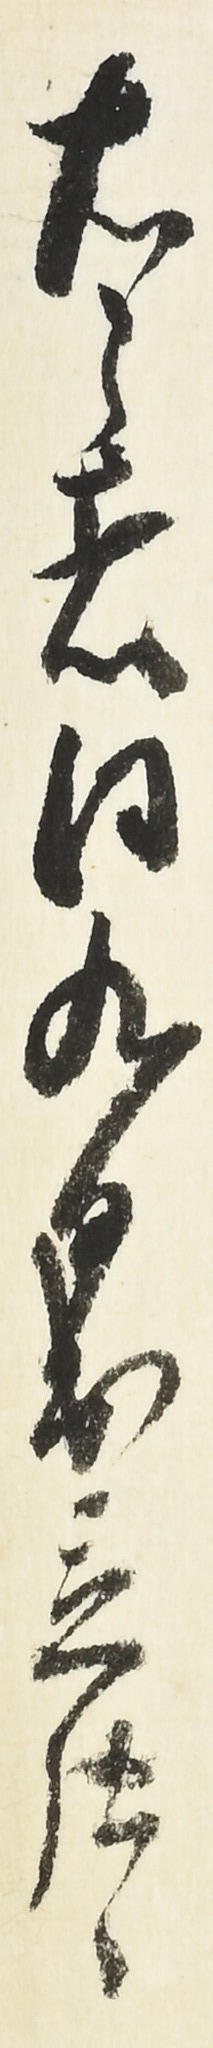右之者同九日出立仕候

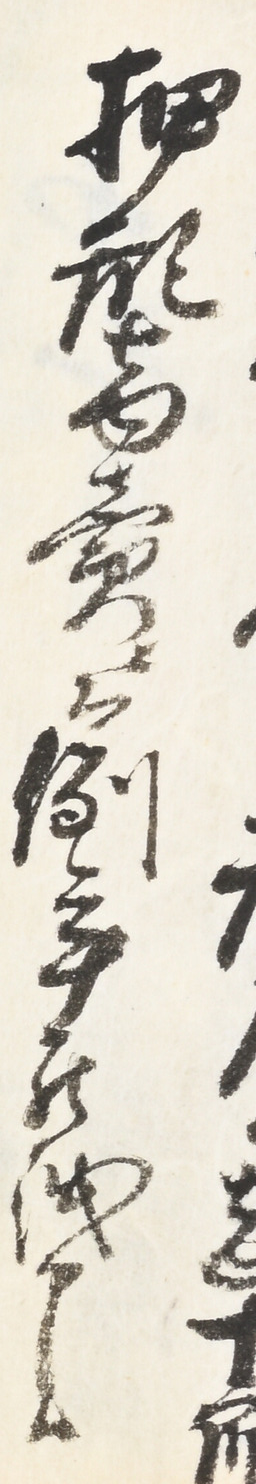薬商売ニ而例年罷越申候
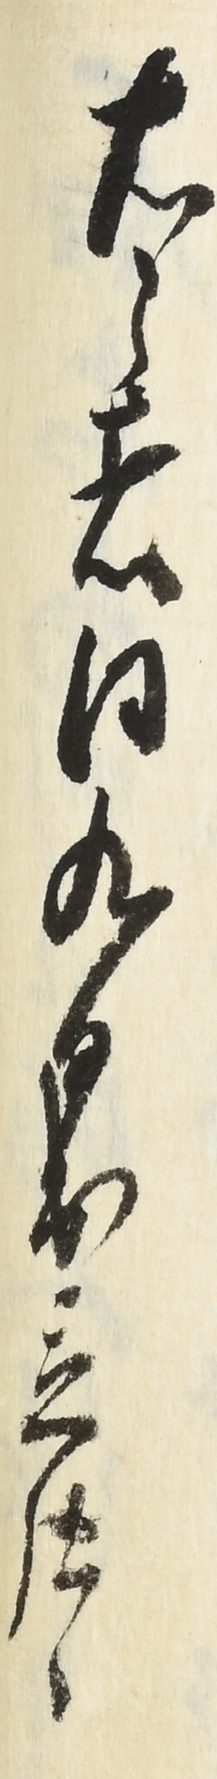右之者同廿日出立仕候
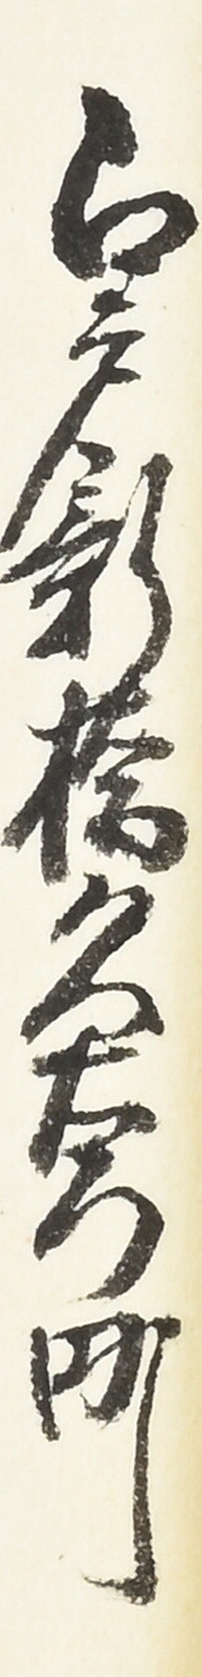江戸新橋久右衛門町
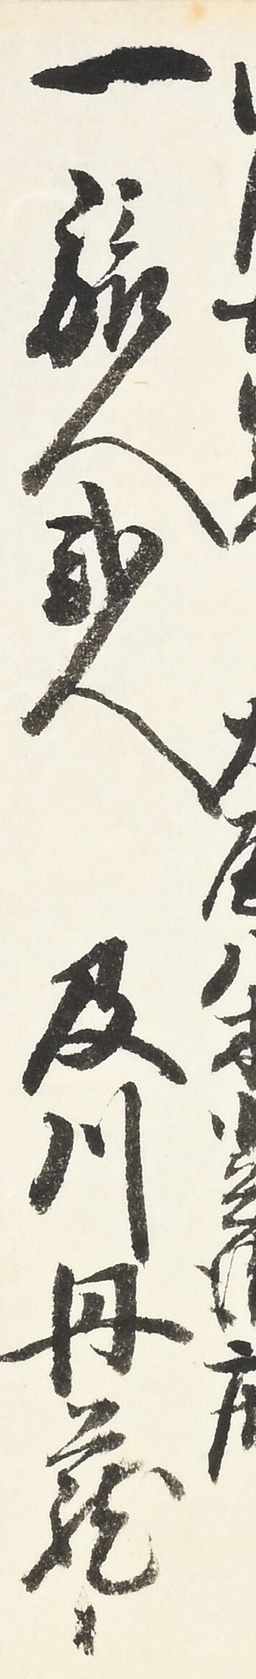一旅人弐人及川丹蔵・
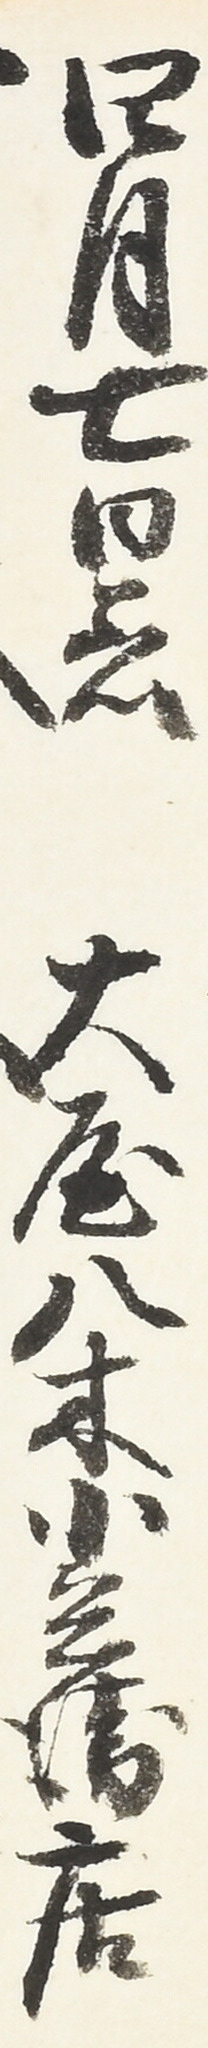四月七日着大屋八木小兵衛店
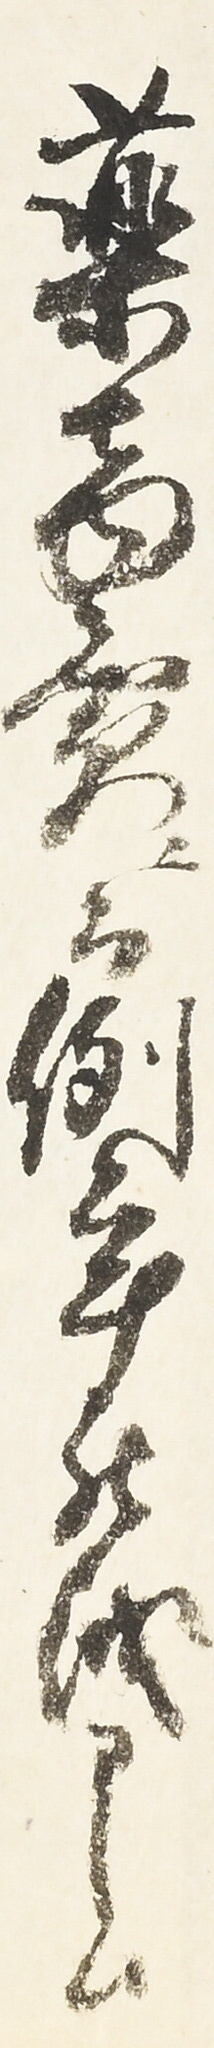薬商売ニ而例年罷越申候
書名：町中旅人泊控帳
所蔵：伊那市立高遠町図書館・合同会社AMANE
